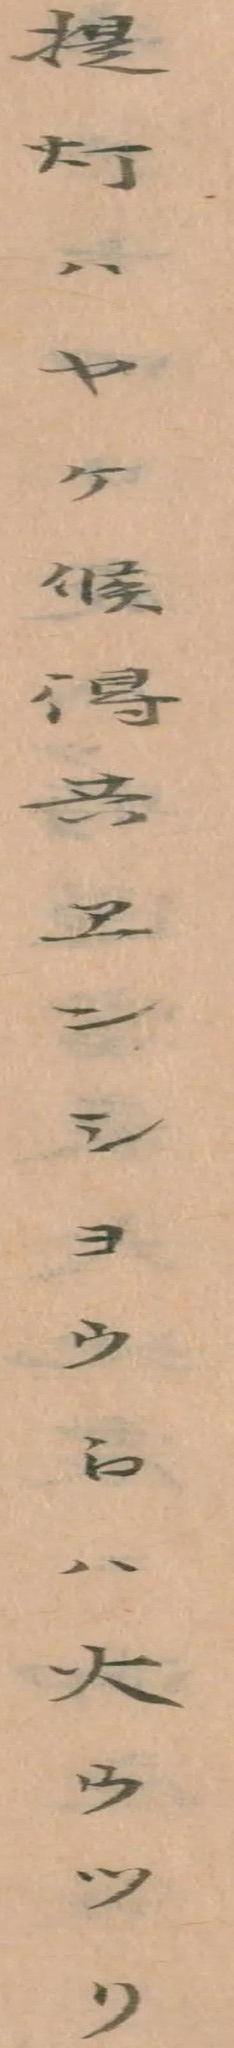提灯ハヤケ候得共エンシヨウ江ハ火ウツリ
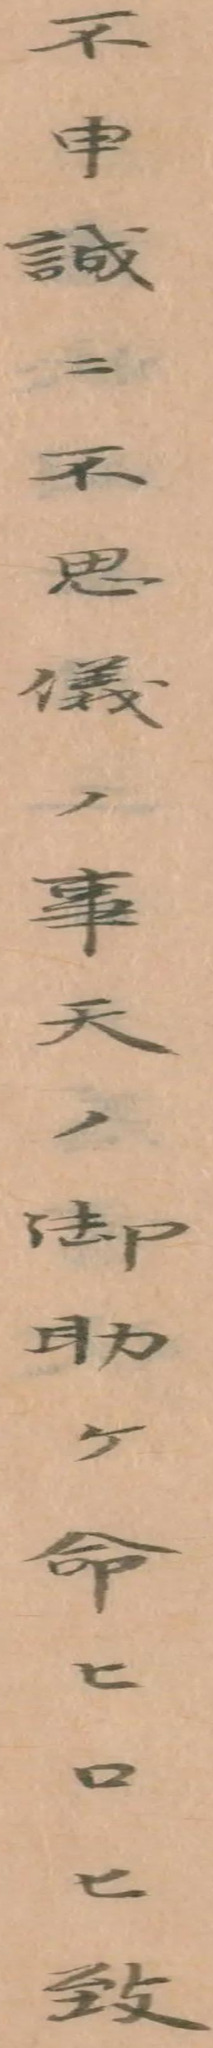不申誠二不思議ノ事天ノ御助ヶ命ヒロヒ致
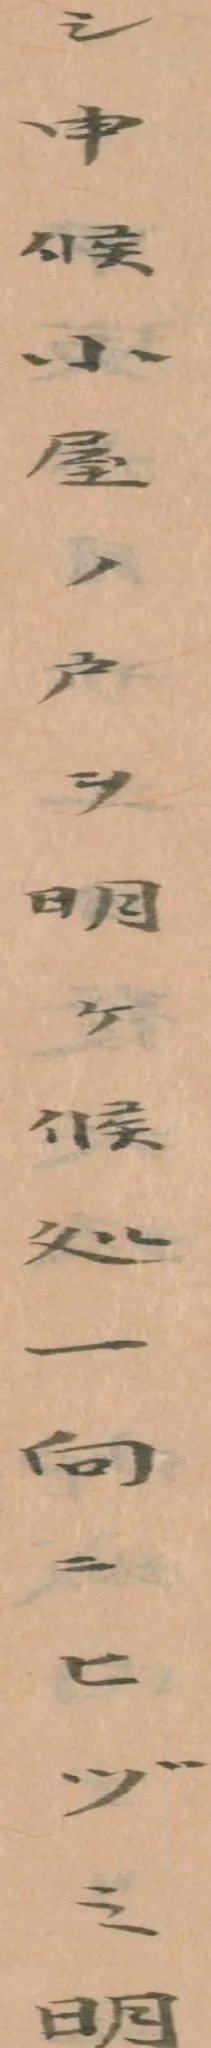シ申候小屋ノ戸ヲ明ヶ候処一向二ニヅミ明
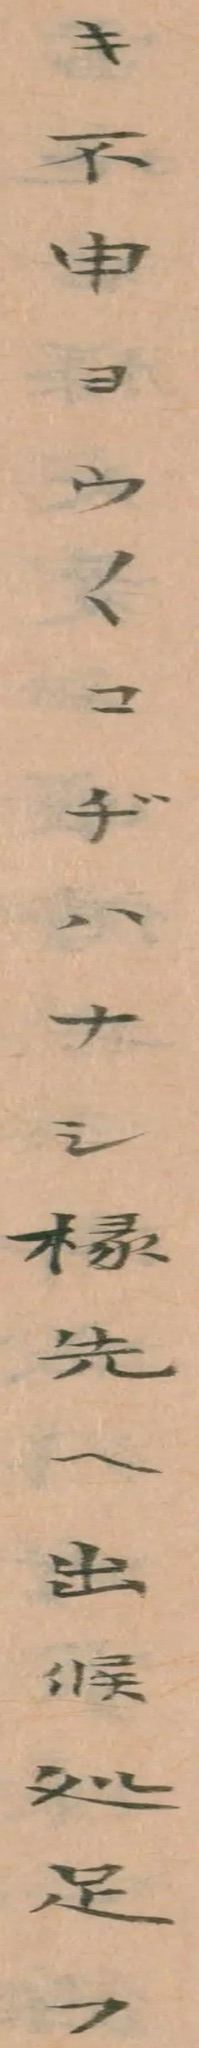キ不申ヨウ〳〵コヂハナシ縁先へ出候処足フ
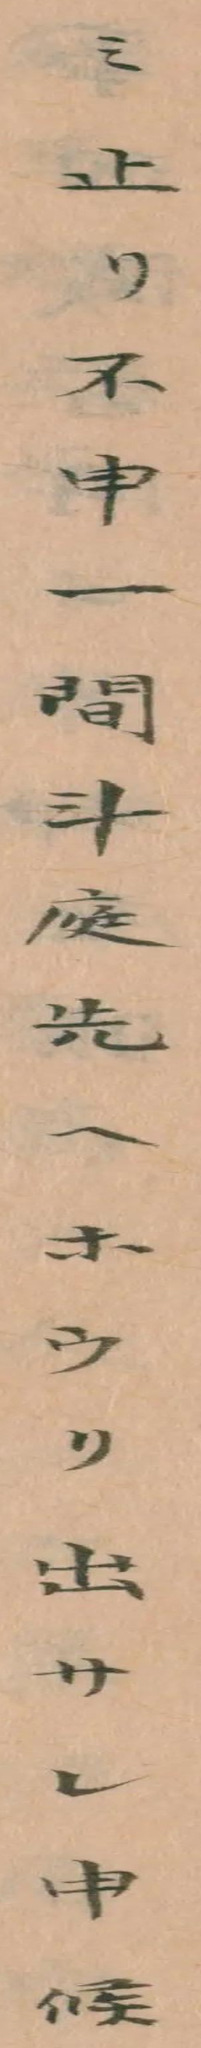ミ止り不申一間斗庭先へホウリ出サレ申候
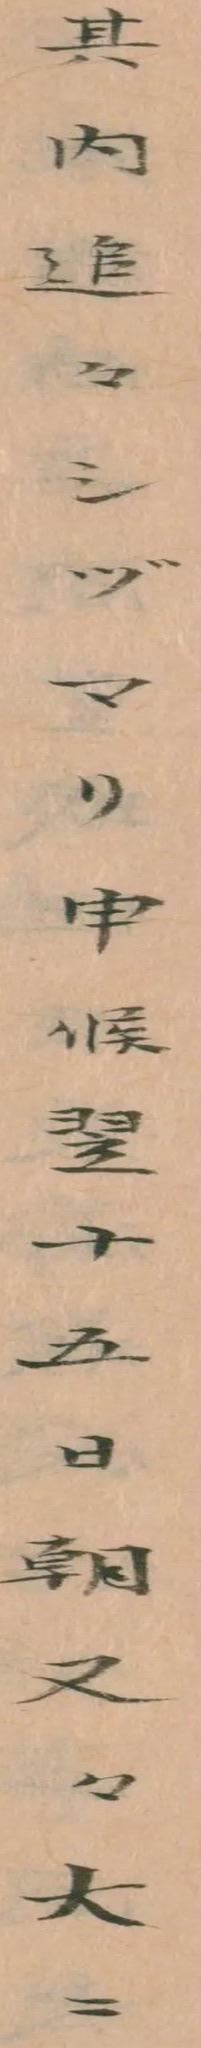其内追々シヅマリ申候翌十五日朝又々大二
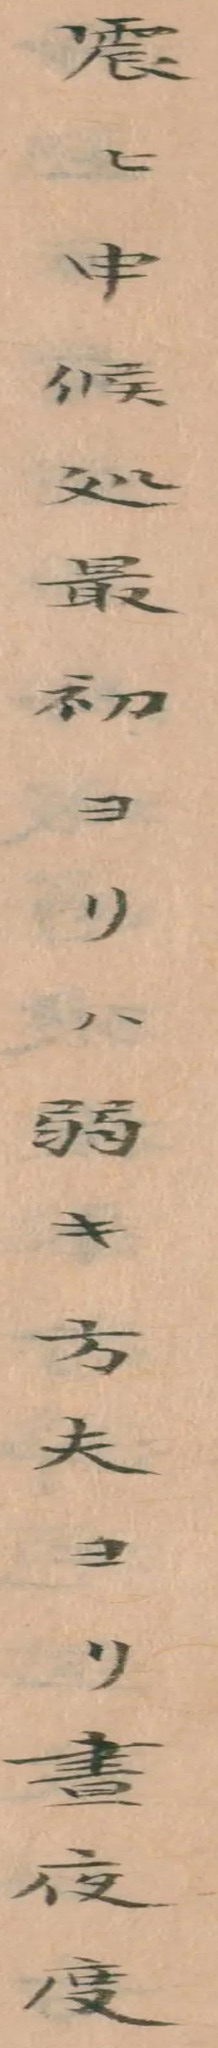震ヒ震候処最初ヨリハ弱キ方夫ヨリ晝夜度
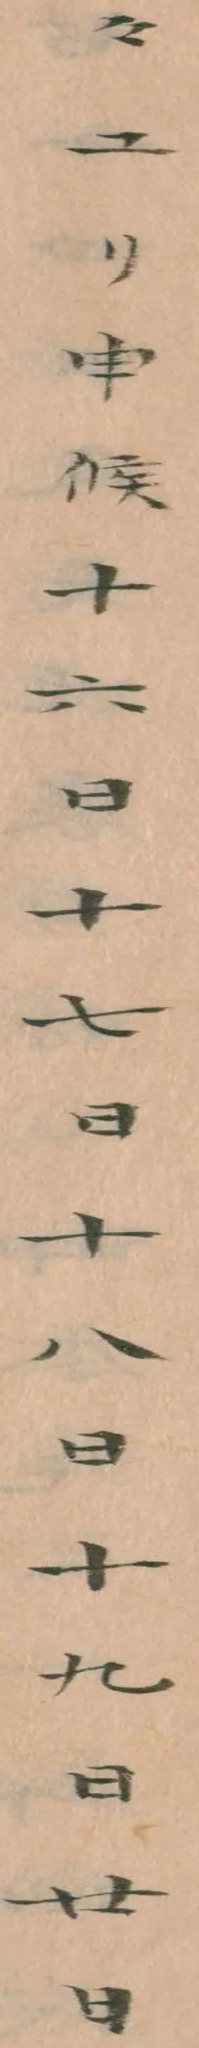々ユリ申候十六日十七日十八日十九日廿日
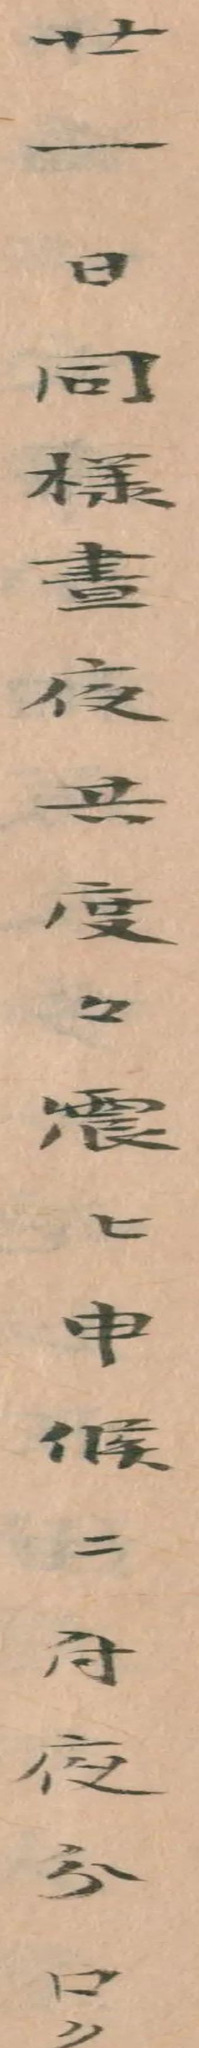廿一日同様晝夜共度々震ヒ申候二付夜分ロク
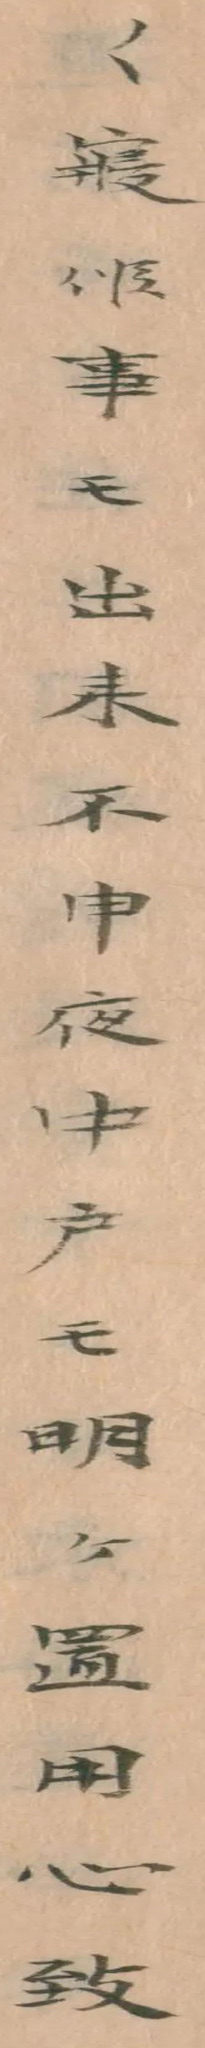〳〵寝候事モ出来不申夜中戸モ明ヶ置用心致
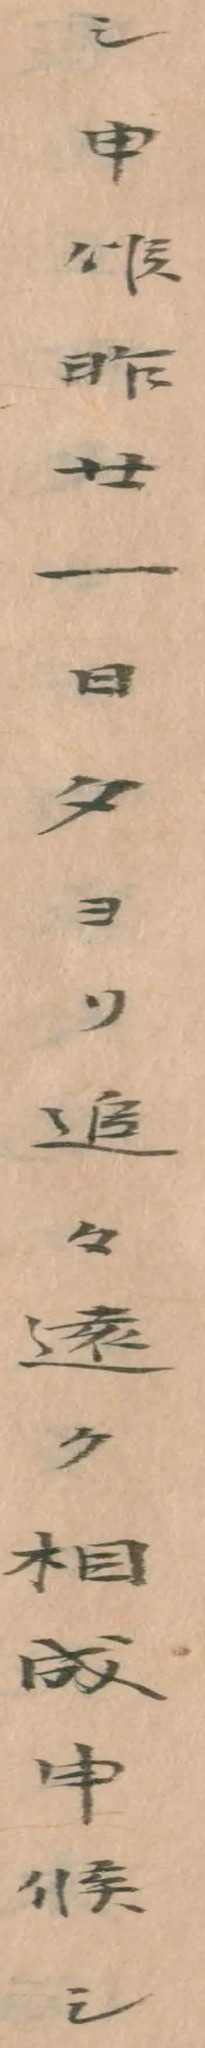シ申候昨廿一日夕ヨリ追々遠ク相成申候シ
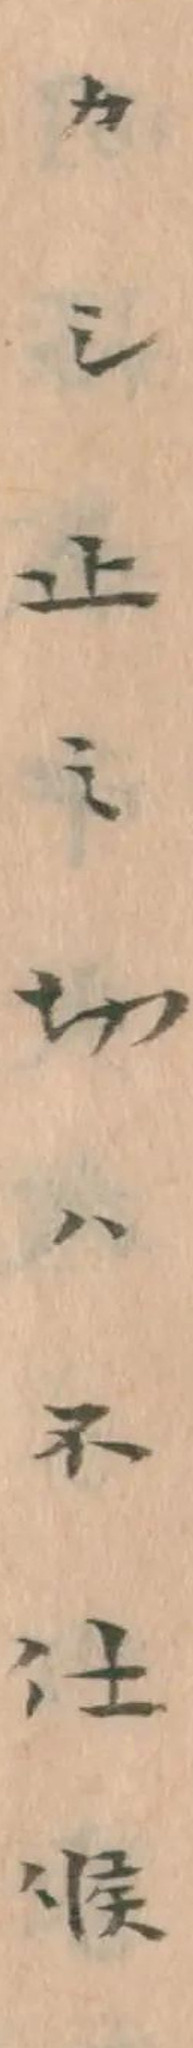カシ止ミ切ハ不仕候
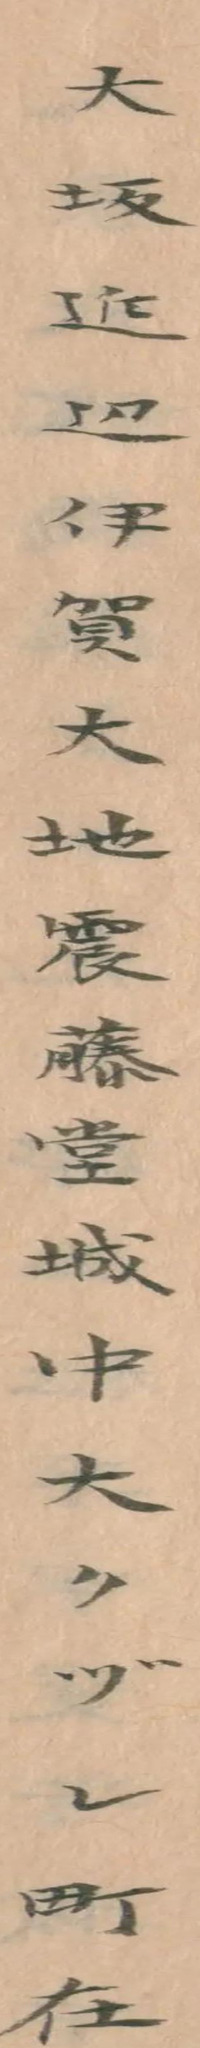一大坂近辺いが伊賀大地震藤堂城大クズレ町在

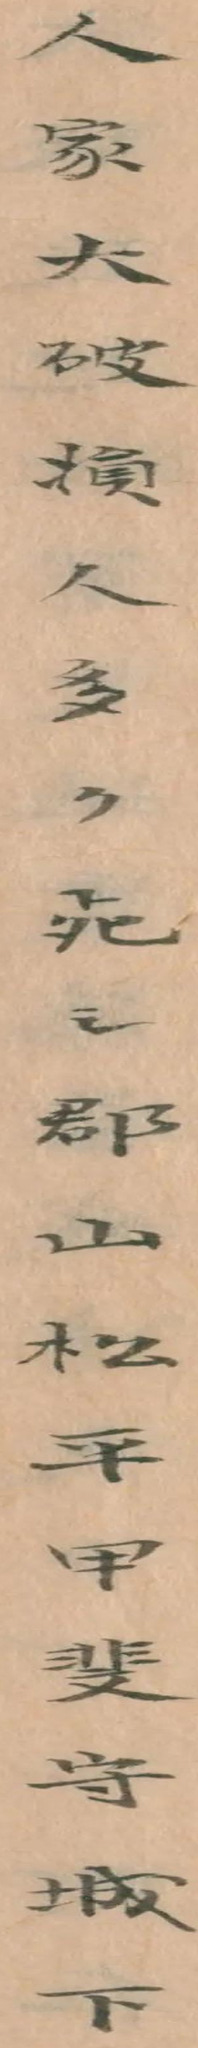人家大破損人多ク死シ郡山松平甲斐守城下
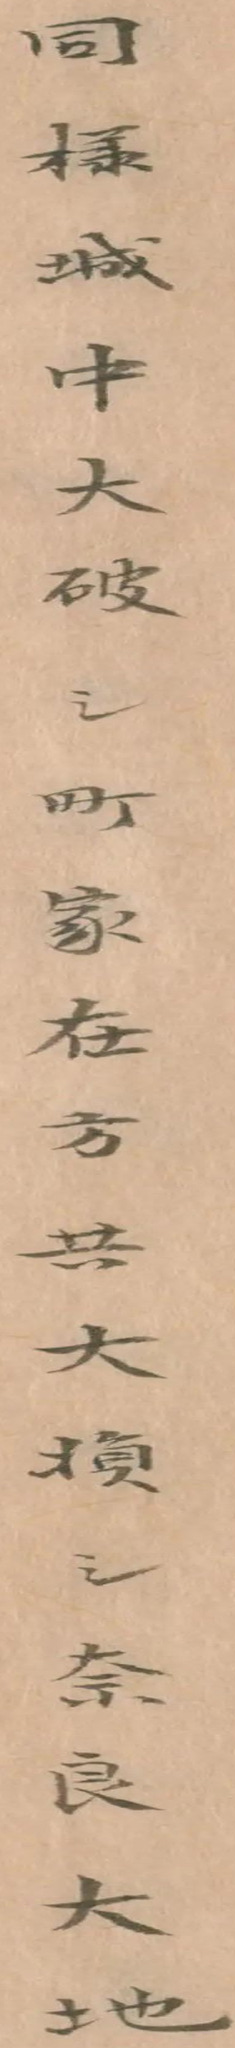同様城中大破シ町家在方共大損シ奈良大地
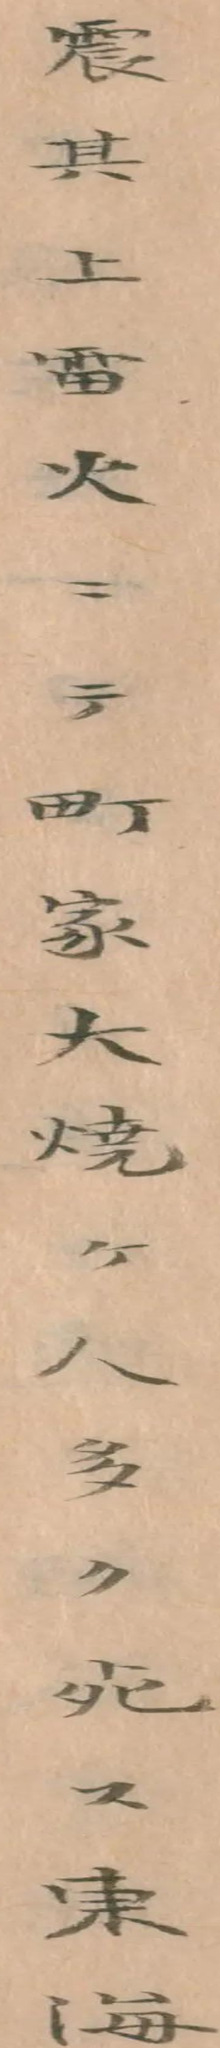震其上雷火ニテ町家大焼ヶ人多ク死ス東海
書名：地災撮要. 巻1(噴火山・地震ノ部)
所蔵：国立国会図書館 National Diet Library, JAPAN
